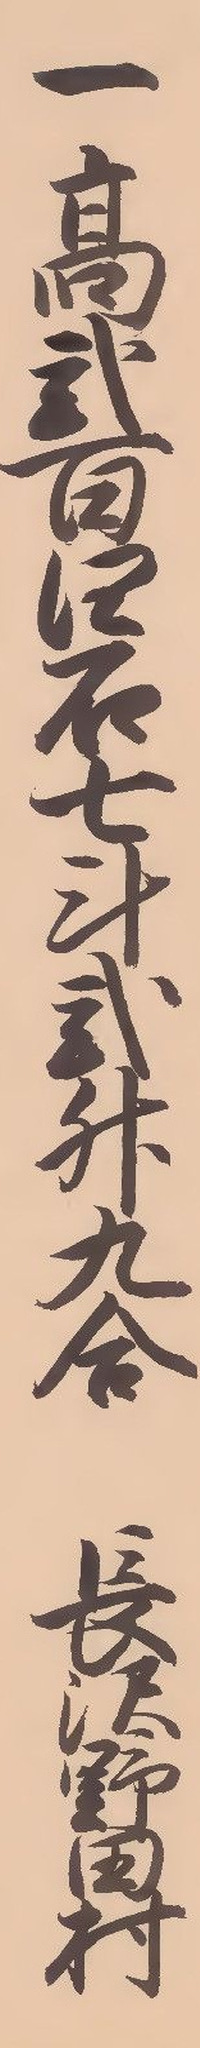一高弐百四石七斗弐升九合長沢野田村
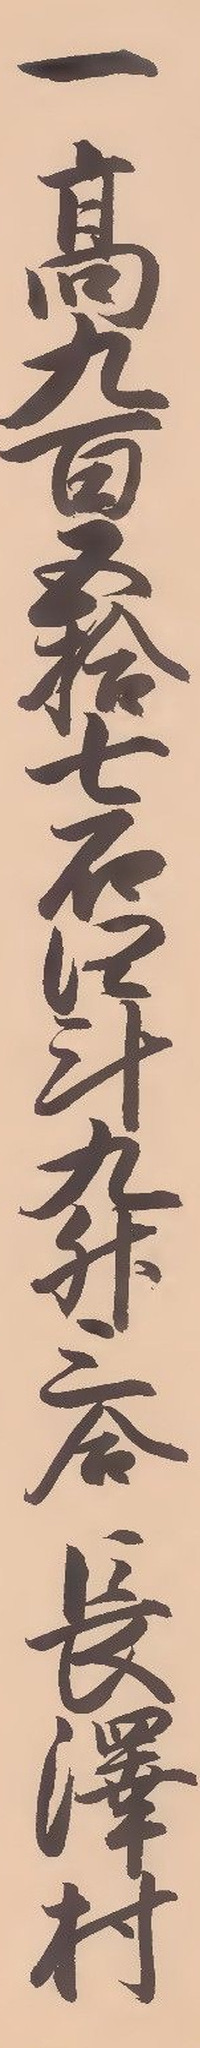一高九百五拾七石四斗九升三合長沢村
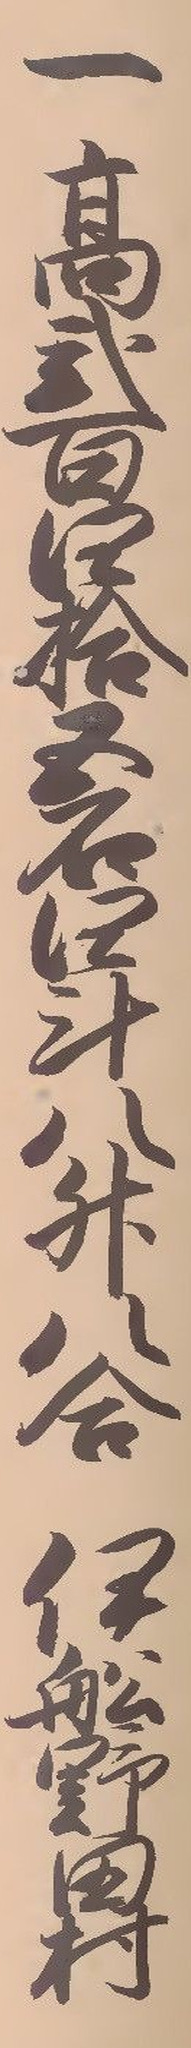一高弐百四拾五石四斗八升八合伊船野田村
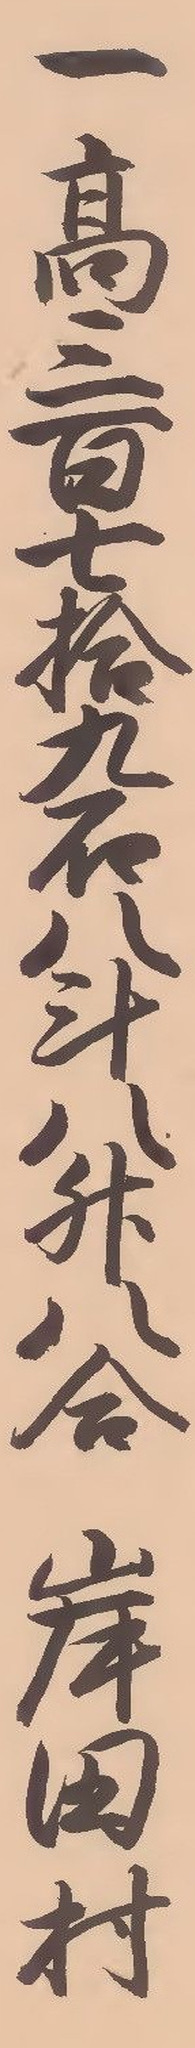一高三百七拾九石八斗八升八合岸田村
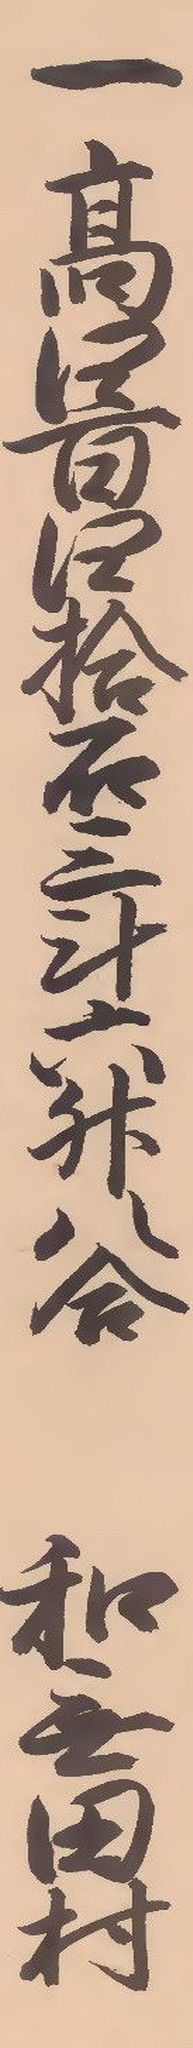一高四百四拾石三斗六升八合和無田村

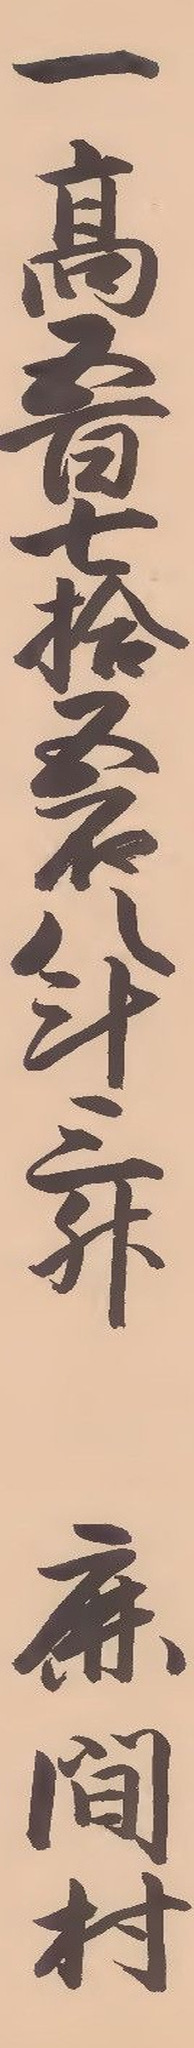一高五百七拾五石八斗三升鹿間村
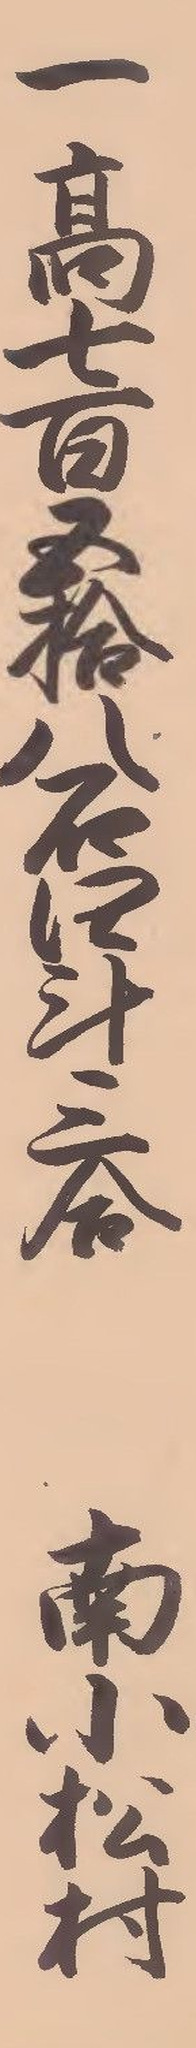一高七百五拾八石四斗三合南小松村
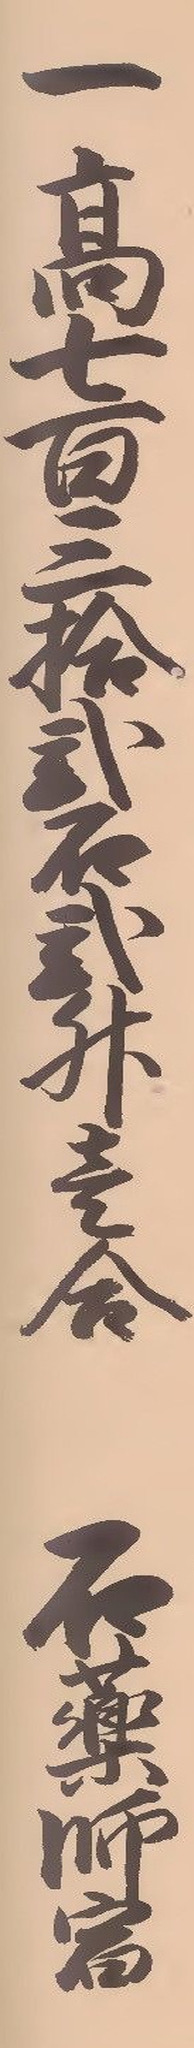一高七百三拾弐石弐升壱合石薬師宿
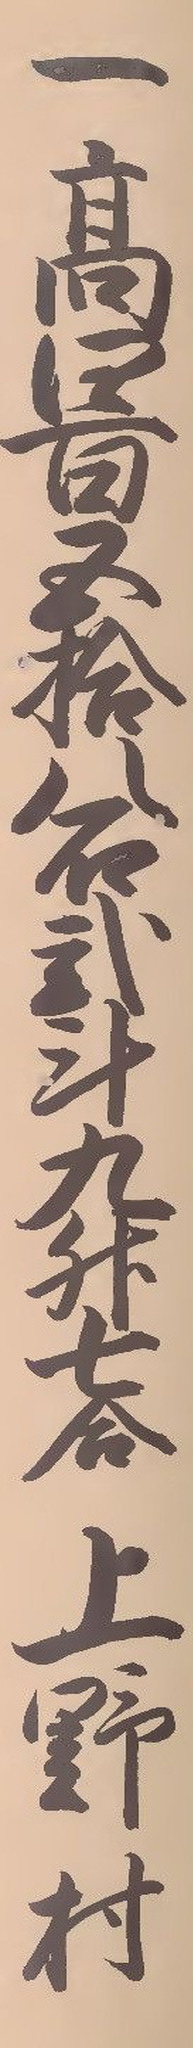一高四百五拾八石弐斗九升七合上野村
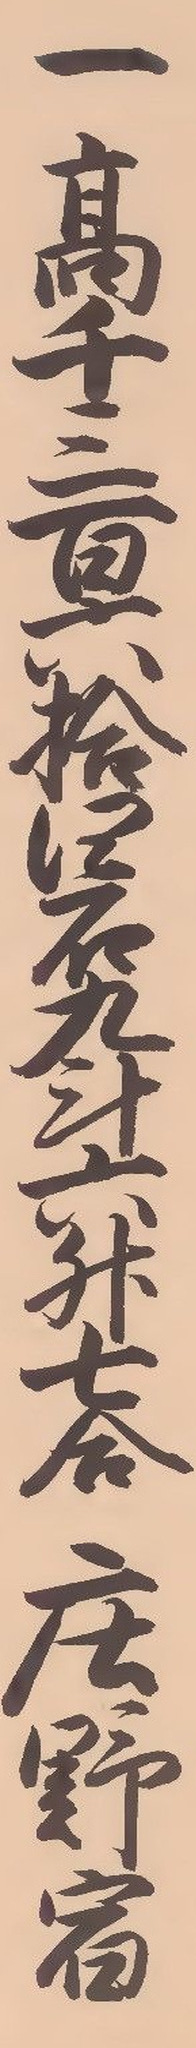一高千三百六拾四石九斗六升七合庄野宿
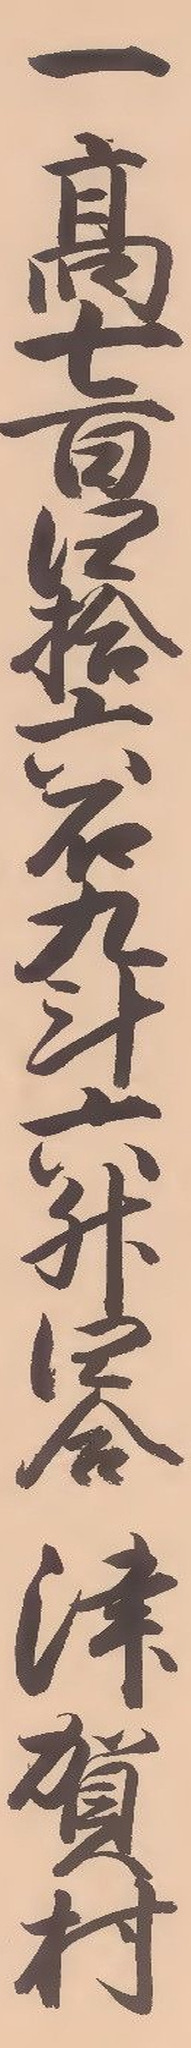一高七百四拾六石九斗六升四合津賀村
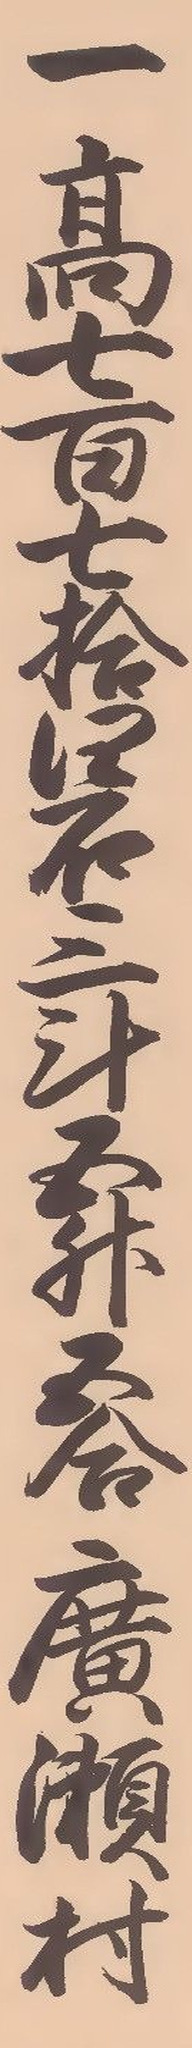一高七百七拾四石三斗五升五合広瀬村

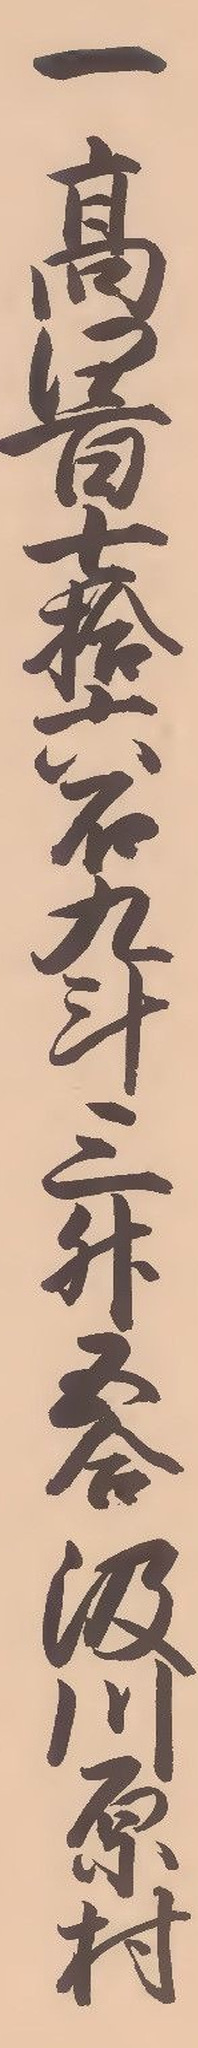一高四百七拾六石九斗三升五合汲川原村
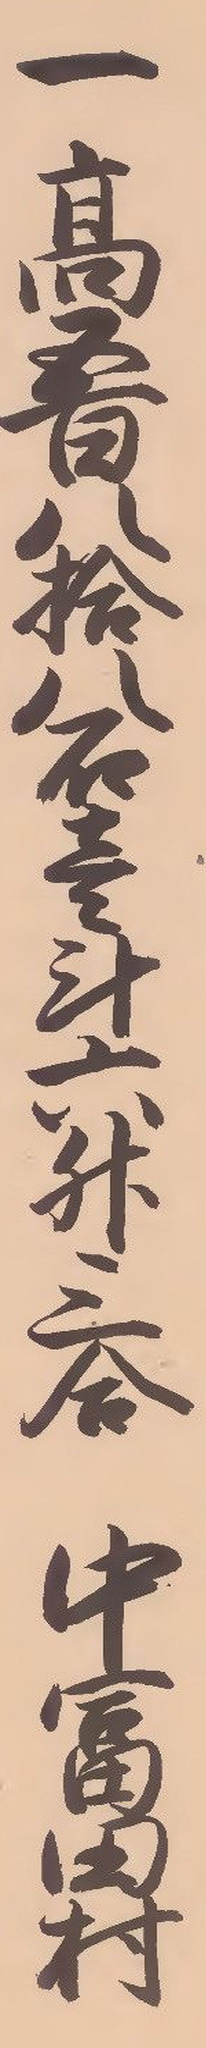一高五百八拾八石壱斗六升三合中富田村
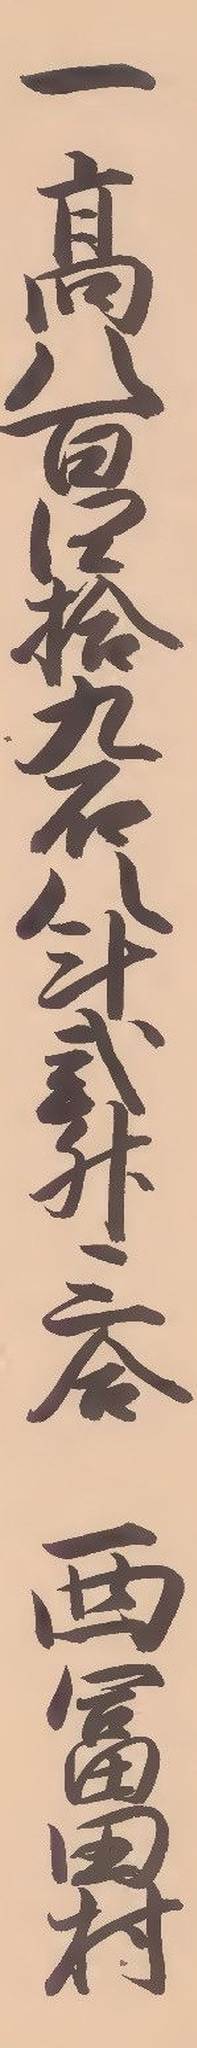一高八百四拾九石八斗弐升三合西富田村
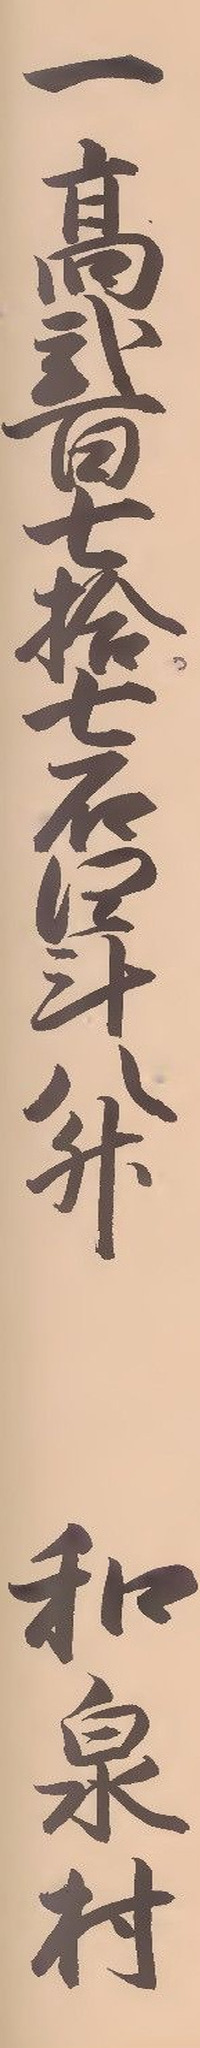一高弐百七拾七石四斗八升和泉村
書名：伊勢国郷帳
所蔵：国立公文書館 National Archives of Japan
